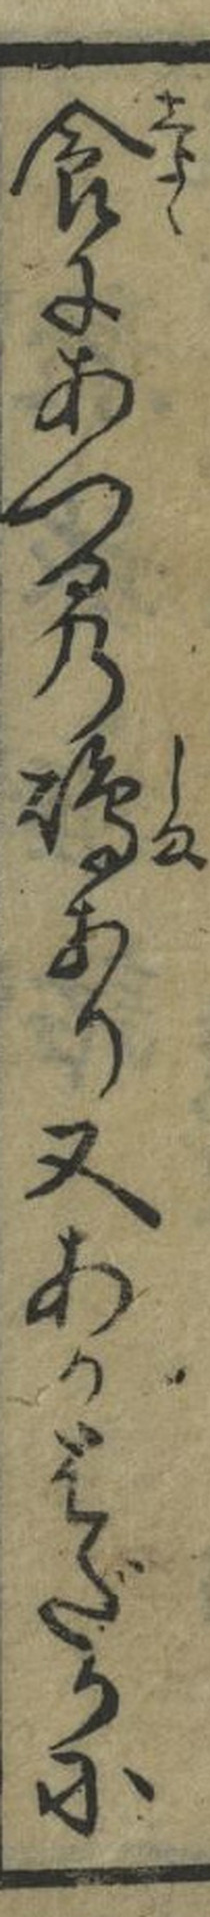食にあつるの島あり又あかはだかに
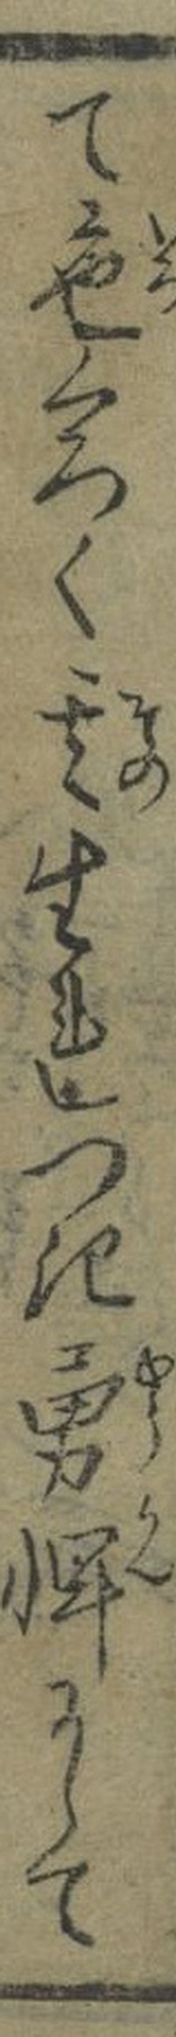て色くろく其生れつき勇悍にして
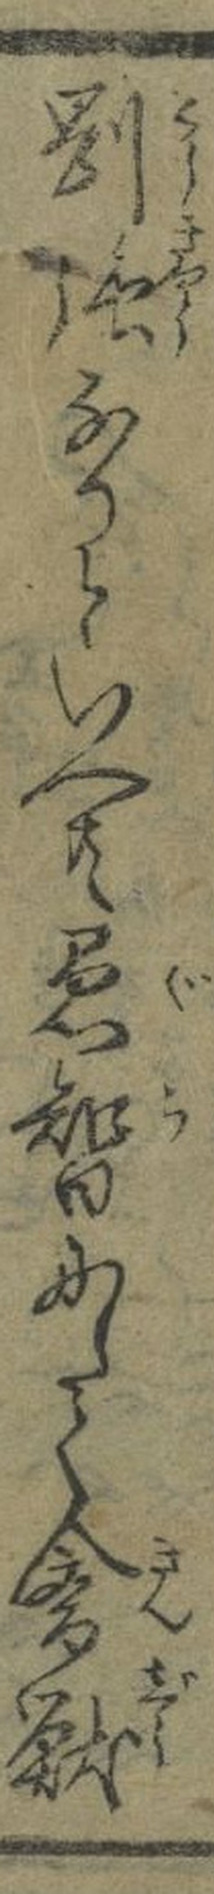剛強なりといへ共愚智にて禽獣
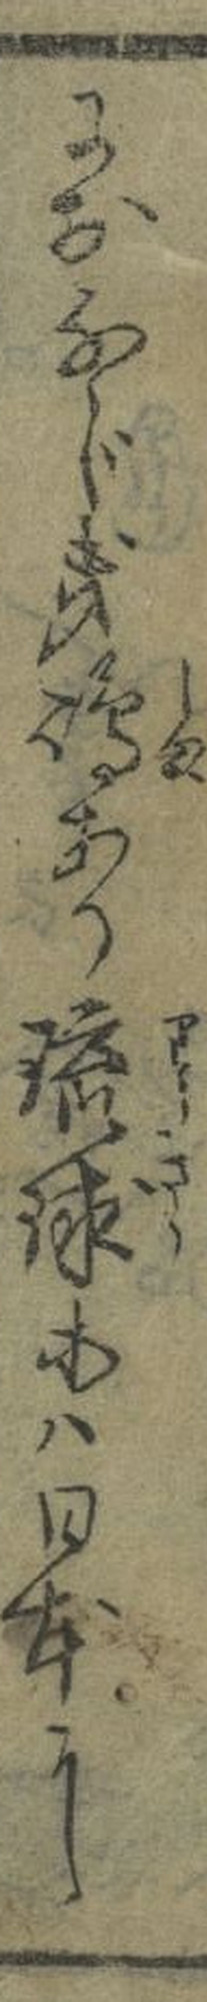におなじき島あり琉球等は日本に
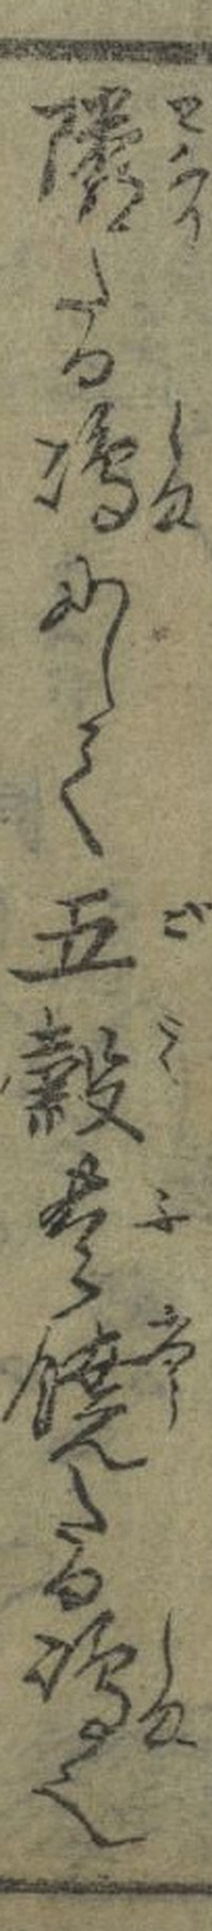隣たる島にて五穀豊饒たる島也
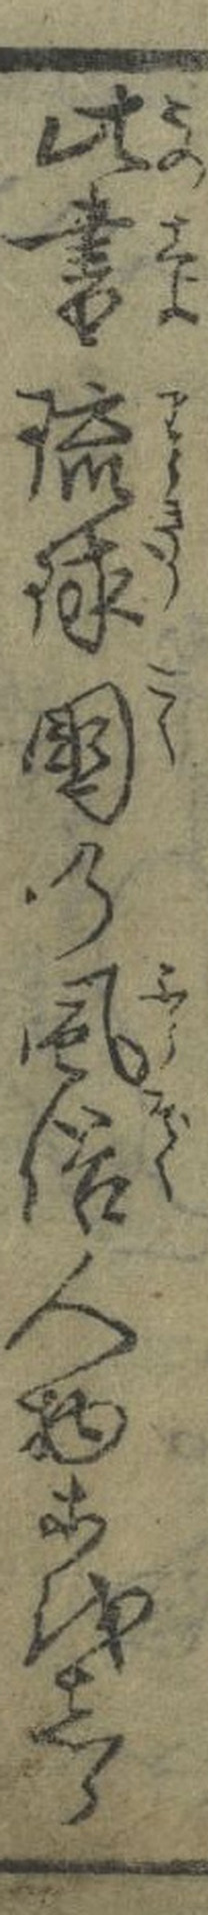此書琉球国の風俗人物等をしら
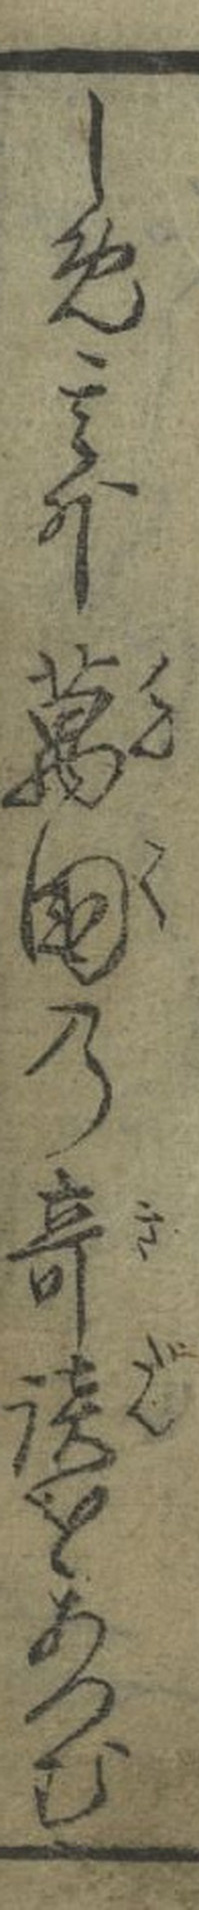しめ其外万国の奇談をあつむ

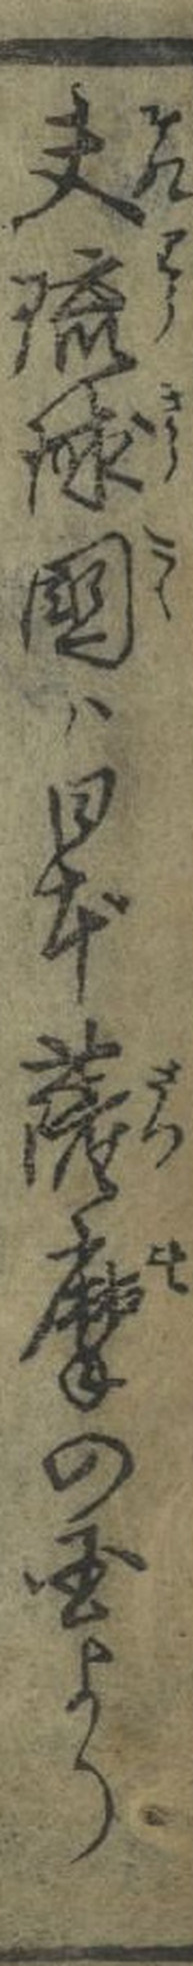夫琉球国は日本薩摩の国より
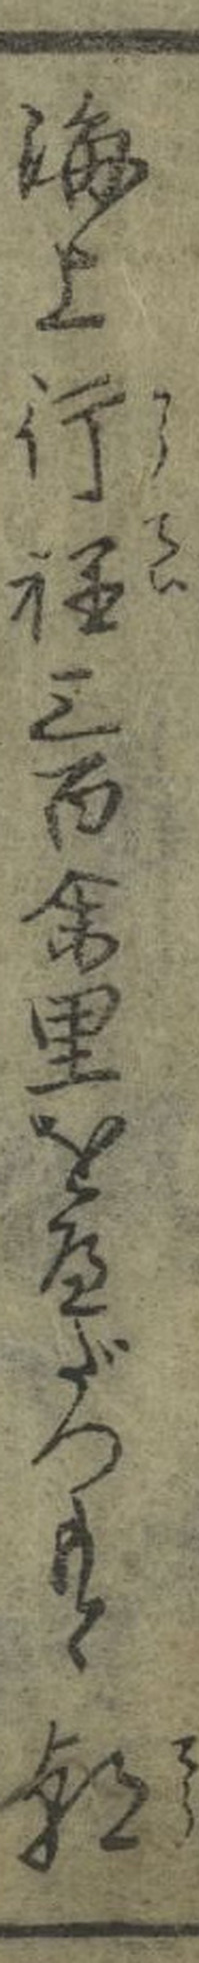海上行程三百余里をへだつもと朝
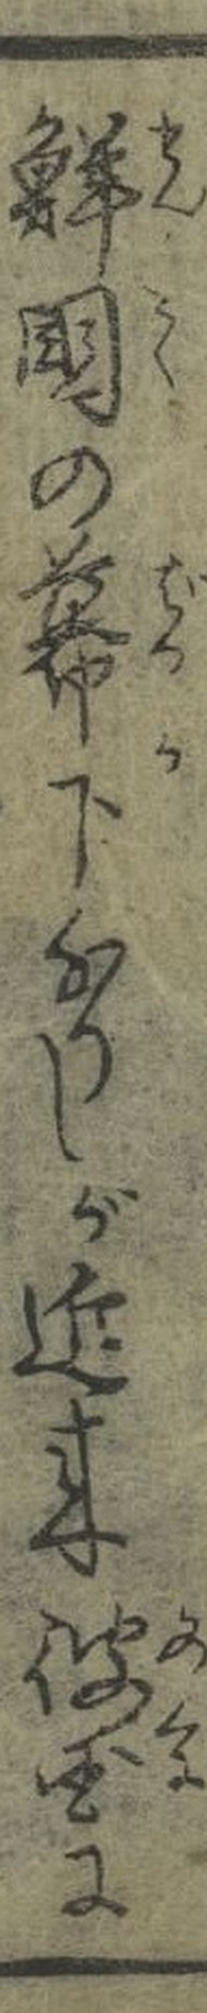鮮国の幕下なりしが近来彼国に
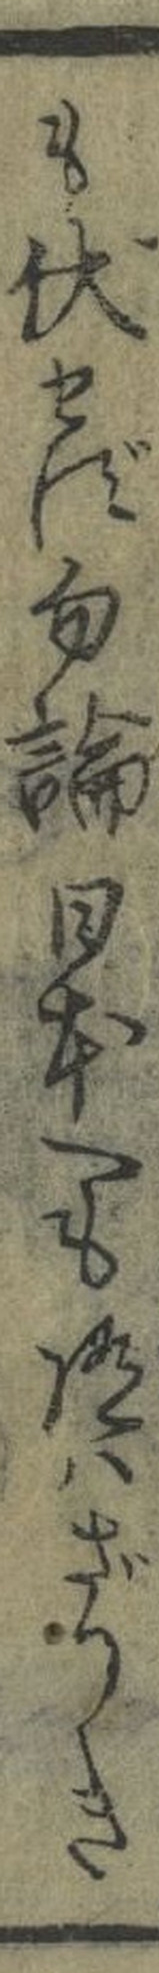も伏せず勿論日本へも陏はざりき
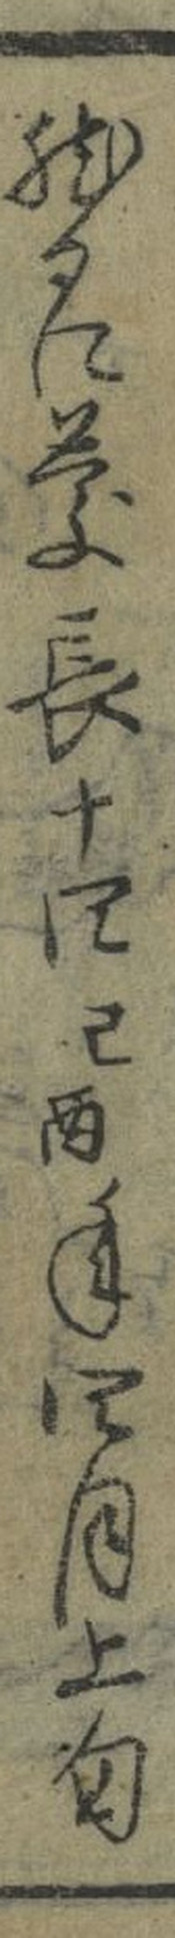然るに慶長十四乙酉年四月上旬
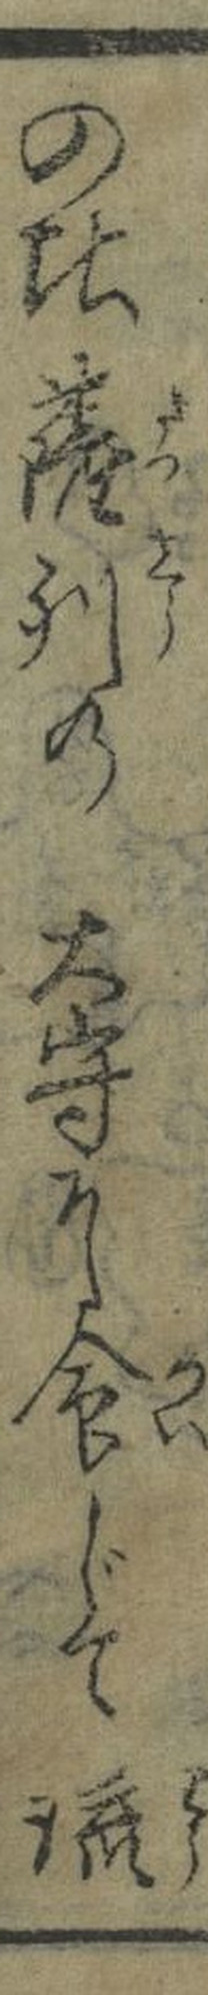の比薩州の大守に命じて琉
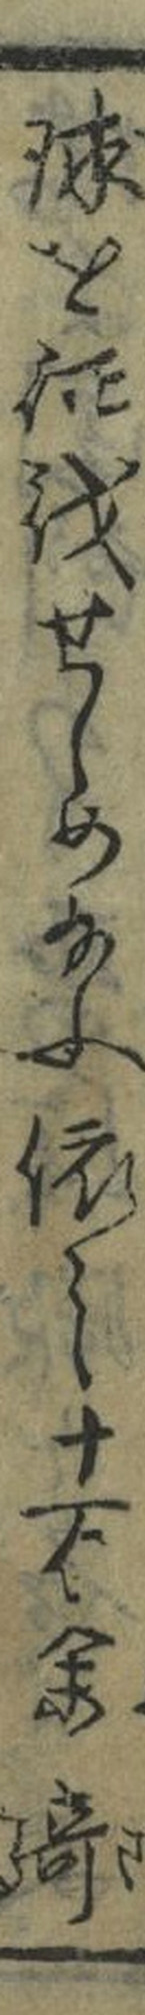球を征伐せしめ給ふ依て十万余騎
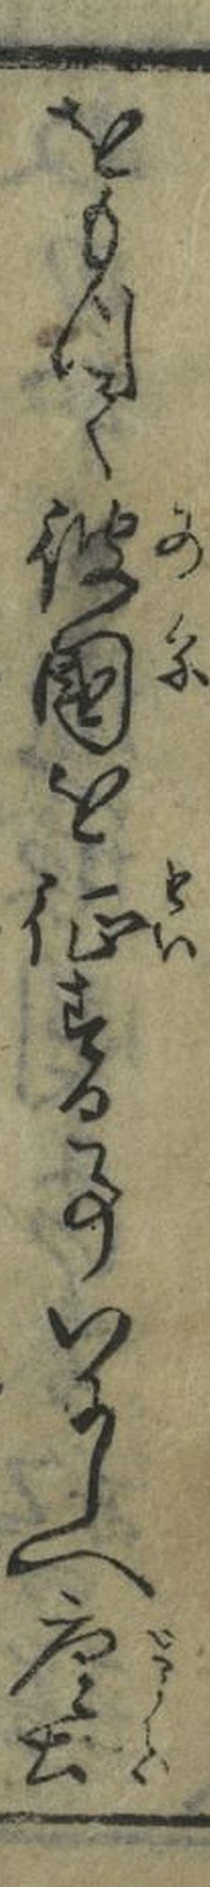をもつて彼国を征する事いにしへ唐土
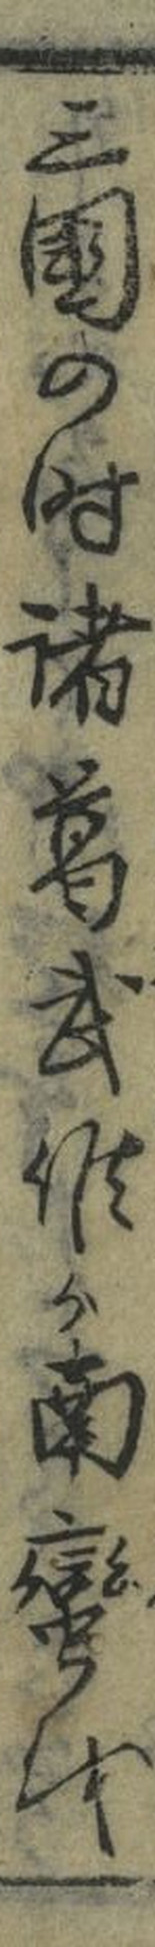三国の時諸葛武侯か南蛮を
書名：琉球雑話
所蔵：University of the Ryukyus Library
